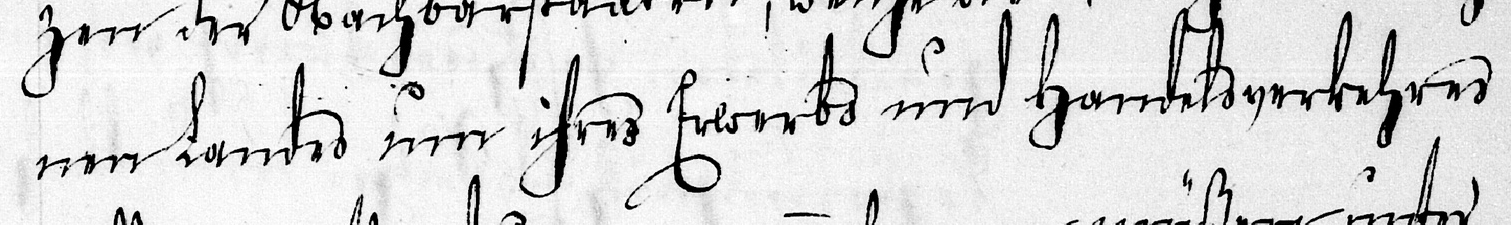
nen Landes um ihres Erwerbs und Handelsverkehres
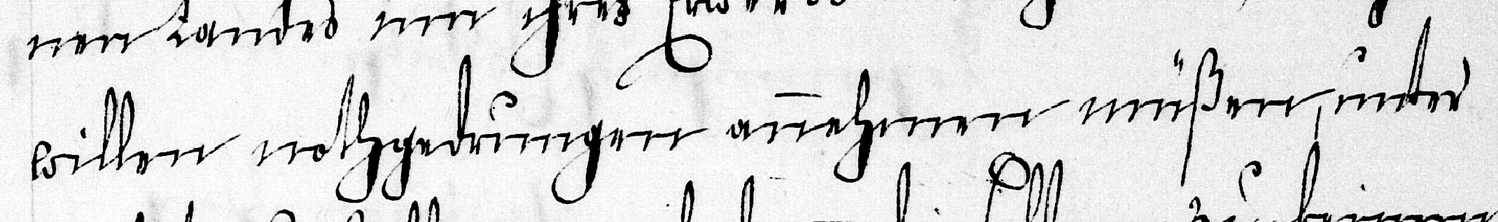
willen nothgedrungen annehmen müßen, unter
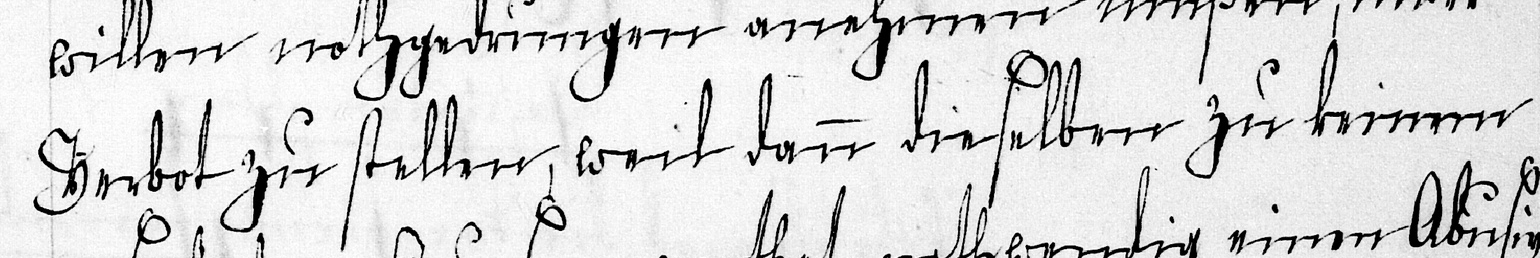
Verbot zu stellen, weil dann dieselben zu keinem
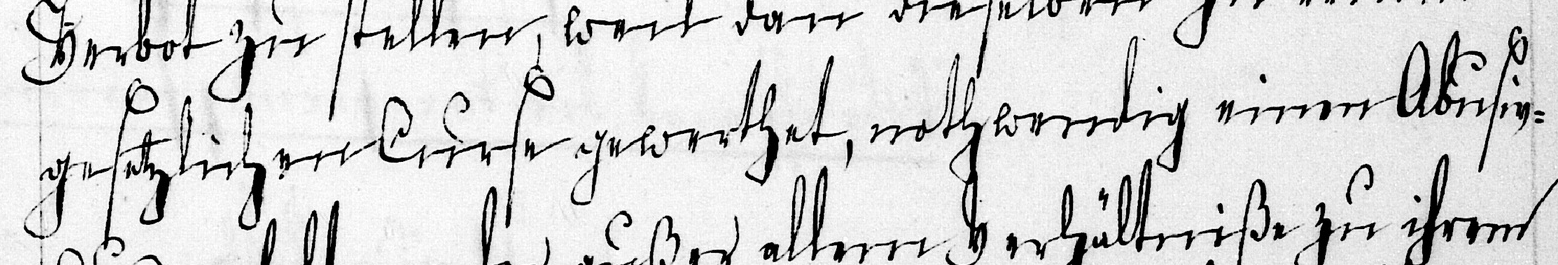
gesetzlichen Curse gewerthet, nothwendig einen Abusi¬
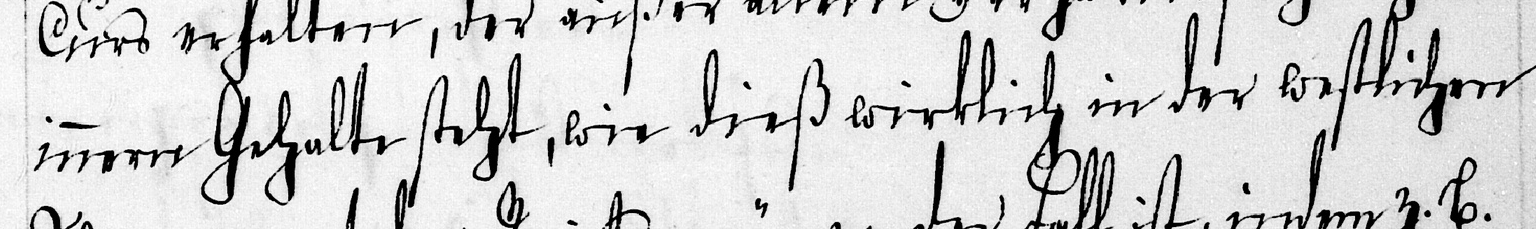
innern Gehalte steht, wie dieß wirklich in der westlichen
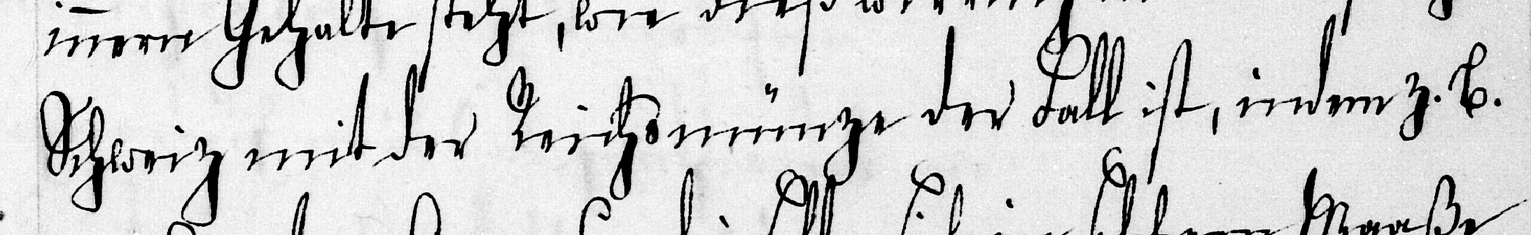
Schweiz mit der Reichsmünze der Fall ist, indem z.B.
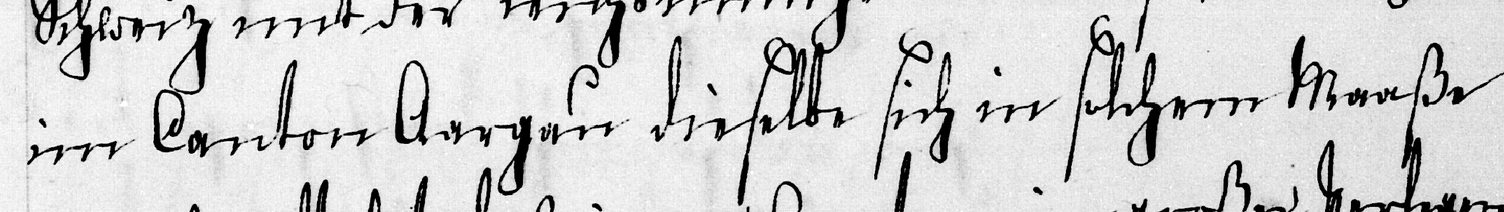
im Canton Aargau dieselbe sich in solchem Maaße
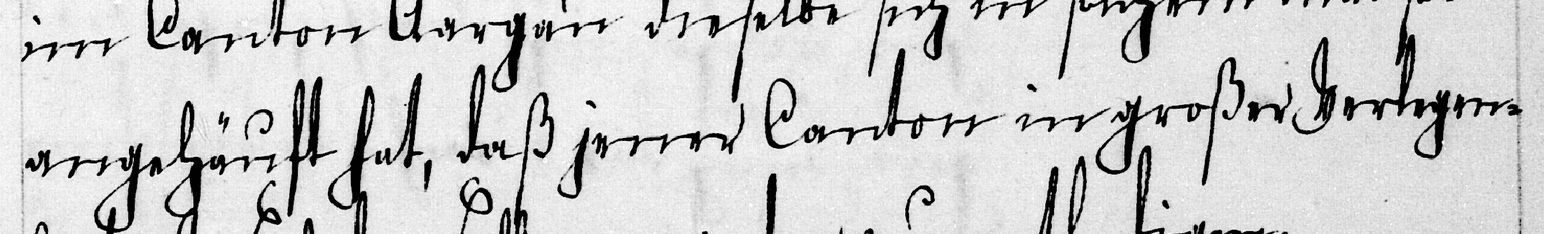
angehäuft hat, daß jener Canton in großer Verlegenh¬
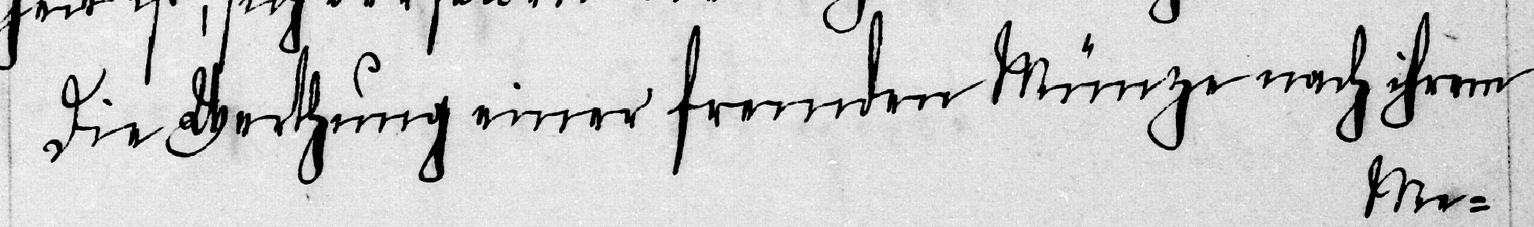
Die Werthung einer fremden Münze nach ihrem
